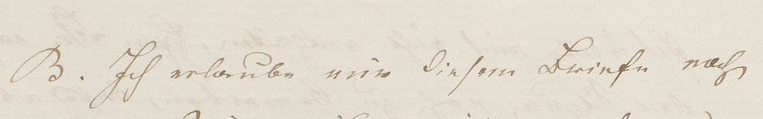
B. Ich erlaube mir diesem Briefe noch
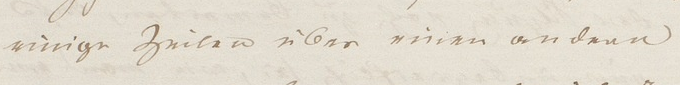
einige Zeilen über einen andern
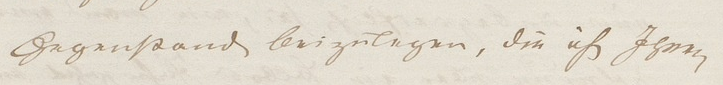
Gegenstand beizulegen, die ich Ihnen
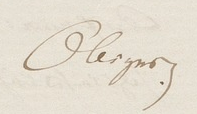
Obiger.
